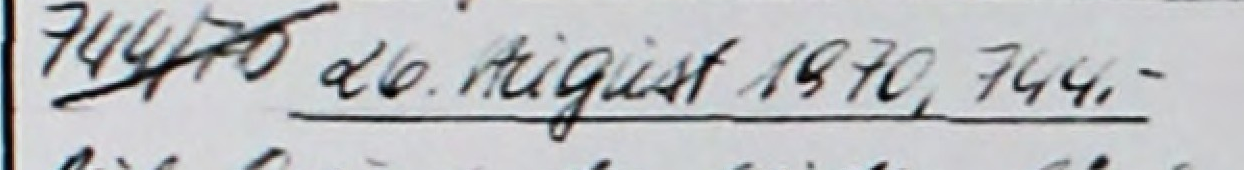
744/70 26. August 1970, 744.-
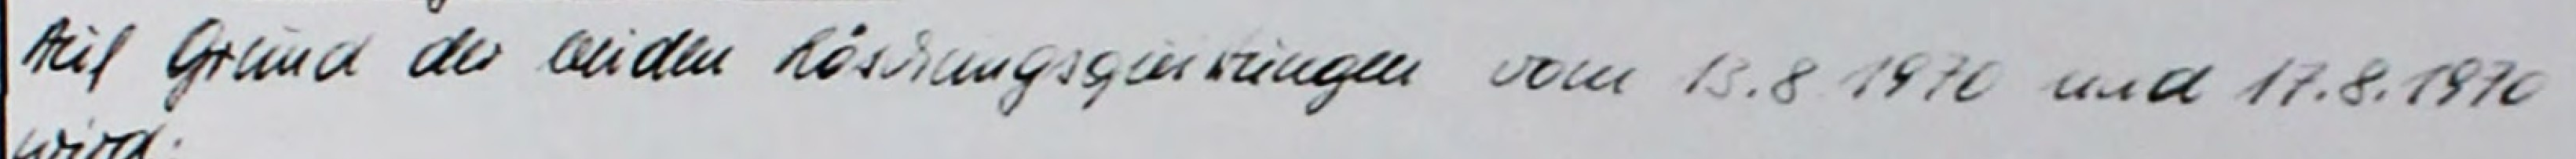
Auf Grund der beiden Löschungsquittungen vom 13.8.1970 und 17.8.1970
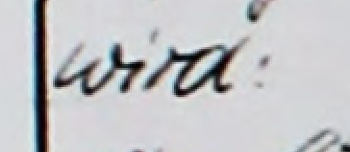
wird:
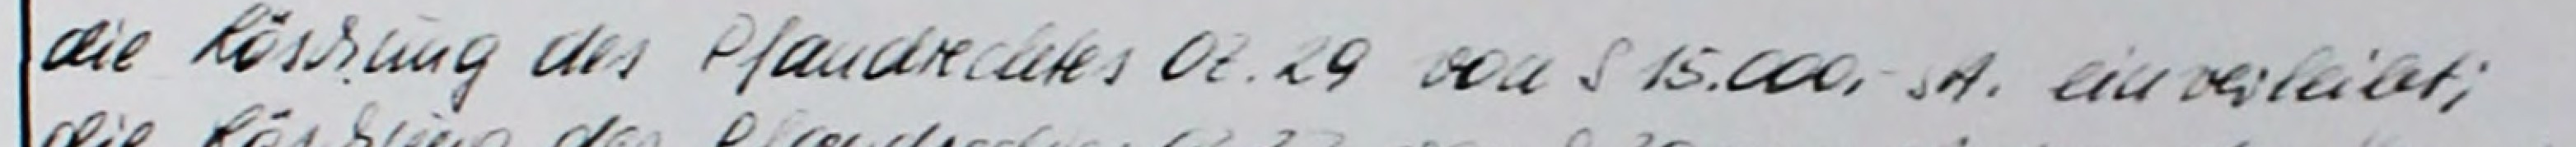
die Löschung des Pfandrechtes OZ. 29 von S 15.000, - sA. einverleibt;
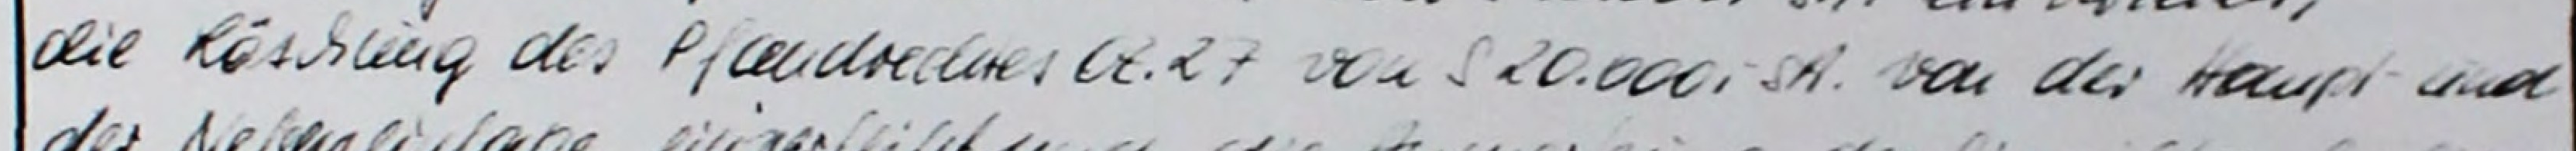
die Löschung des Pfandrechtes OZ. 27 von S 20.000, - sA. der Haupt- und
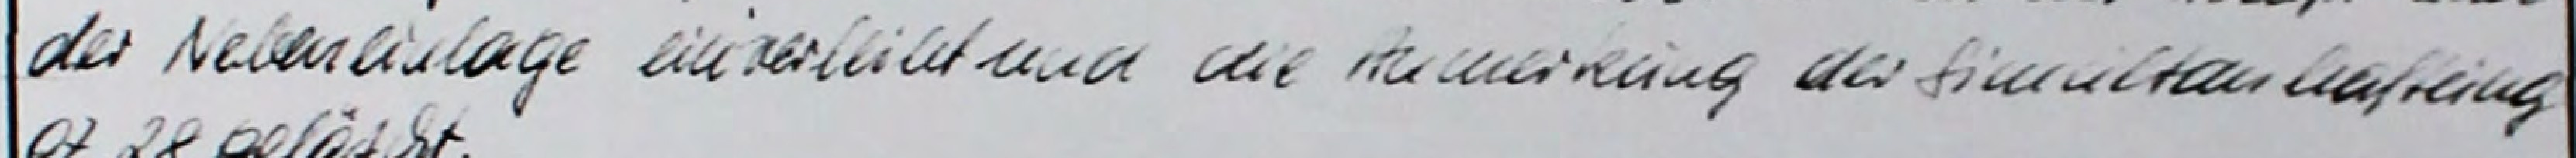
der Nebeneinlage einverleibt und die Anmerkung der Simultanhaftung
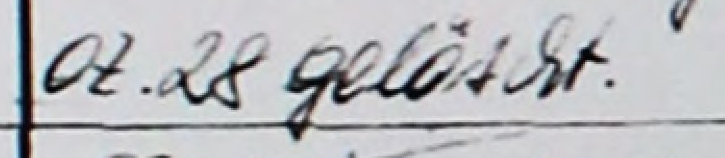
OZ. 28 gelöscht.
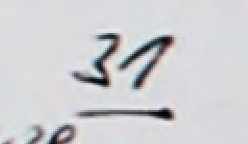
31
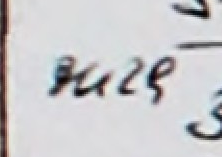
zu 29
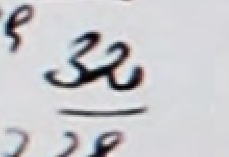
32
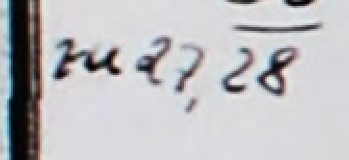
zu 27, 28
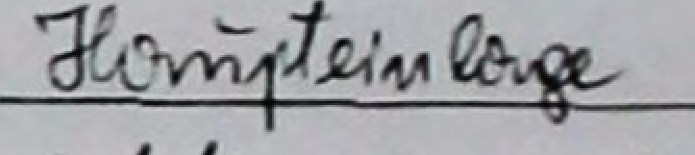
Haupteinlage
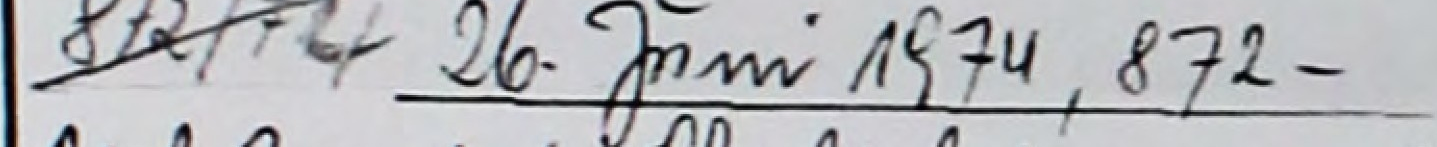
872/74 26. Juni 1974, 872 -
